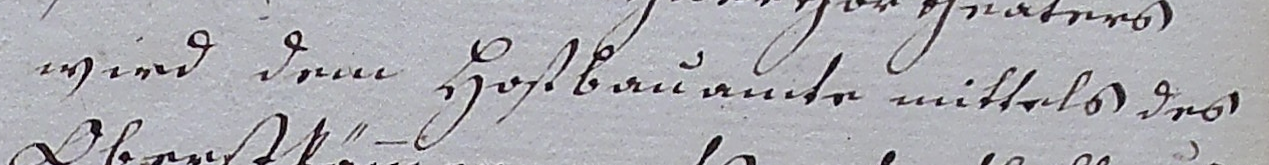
wird dem Hofbeamte mittels des
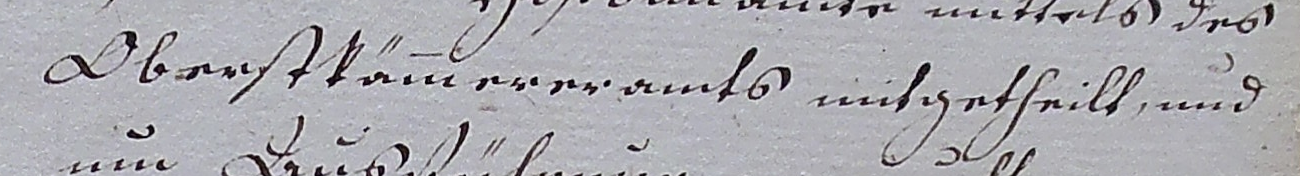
Oberstkäm̅ereramts mitgetheilt nund
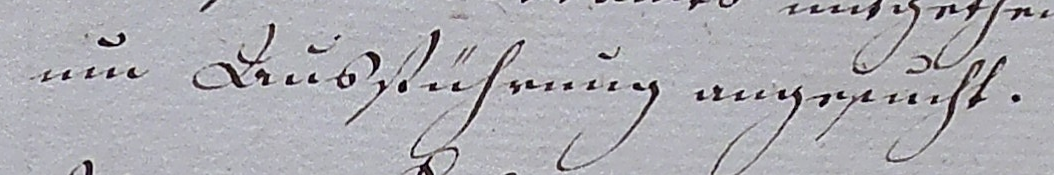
um Ausführung angesucht.
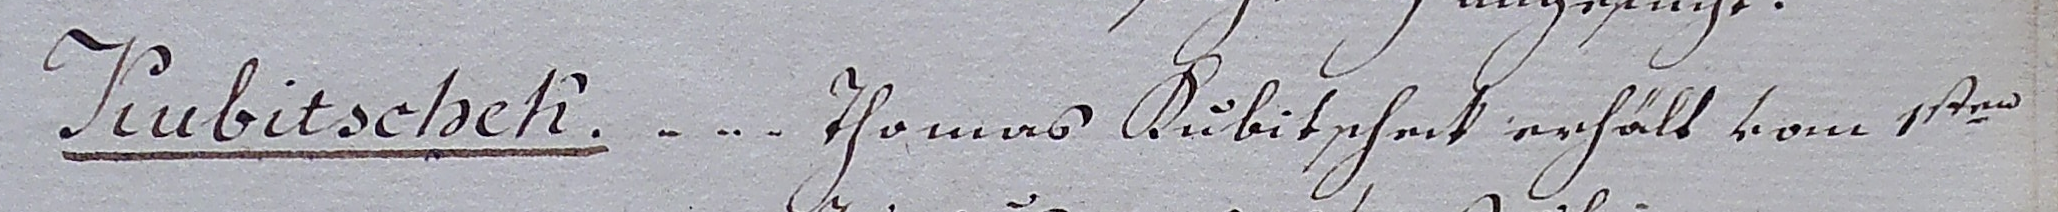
Kubitschek. .. .. .. Thomas Kubitschek erhält vom 1ste͇n
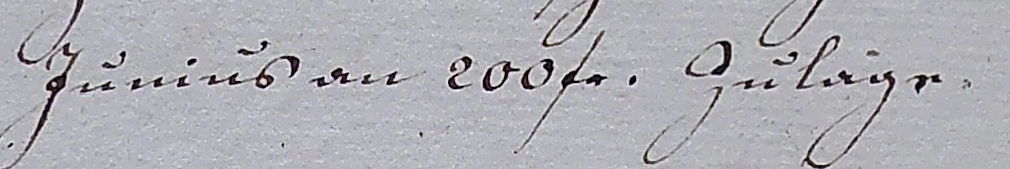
Junius an 200fr. Zulage.
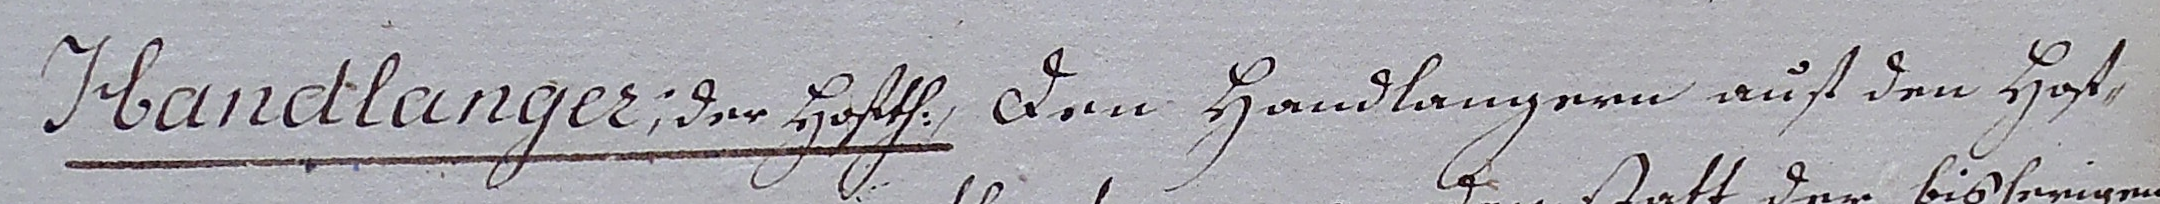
Handlanger; der Hofth:, Den Handlangern auf den Hf¬
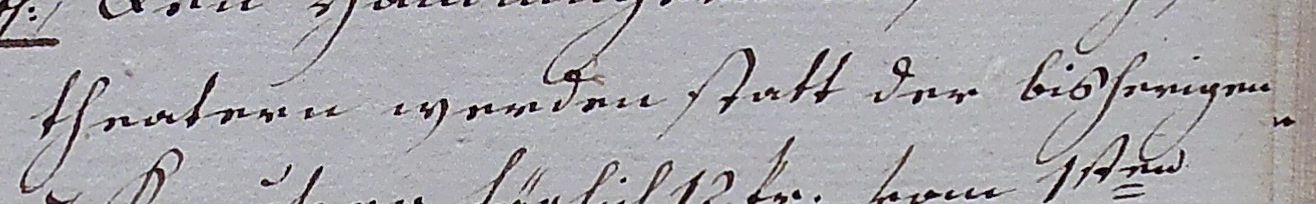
theatern werden statt der bisherigen
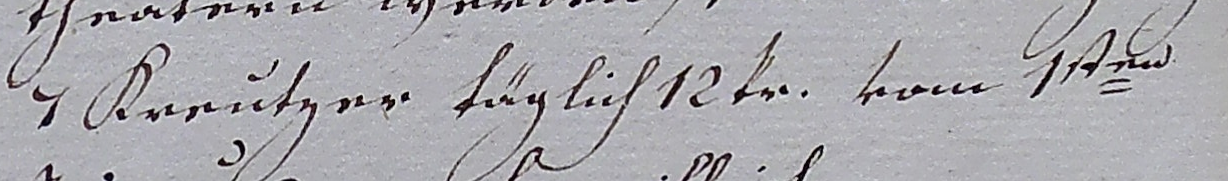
7 Kreutzer täglich 12 kr. vom 1ste͇n
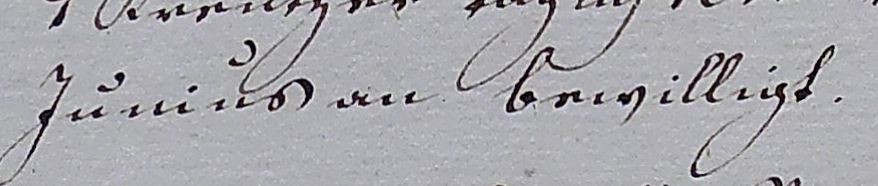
Junius an bewilligt.
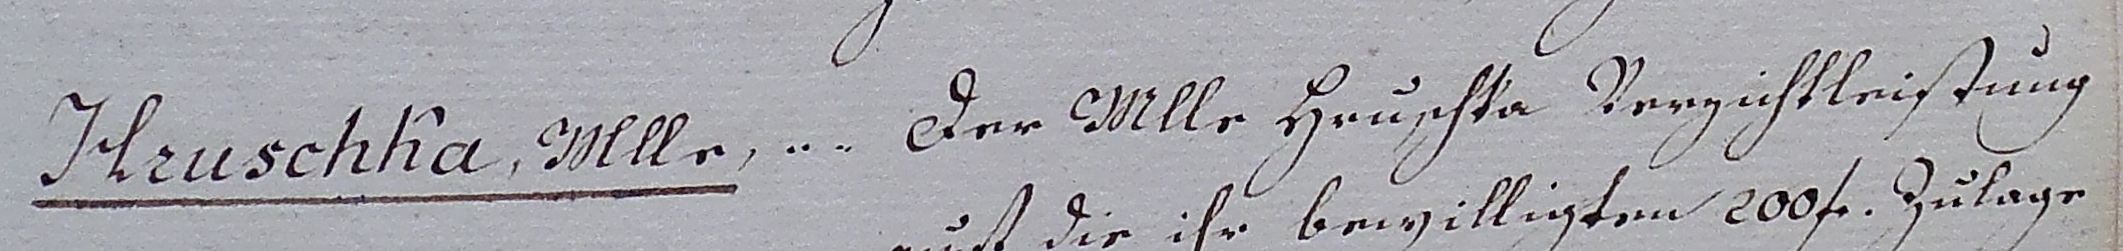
Hruschka, Mlle, .. .. Der Mlle Hruschka Verzichtleistung
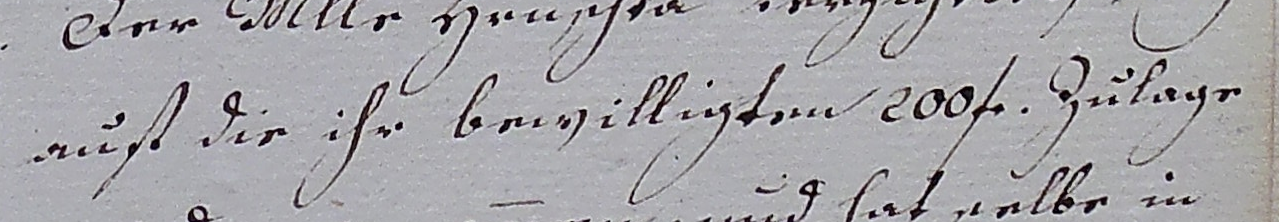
auf die ihr bewilligten 200fr. Zulage
